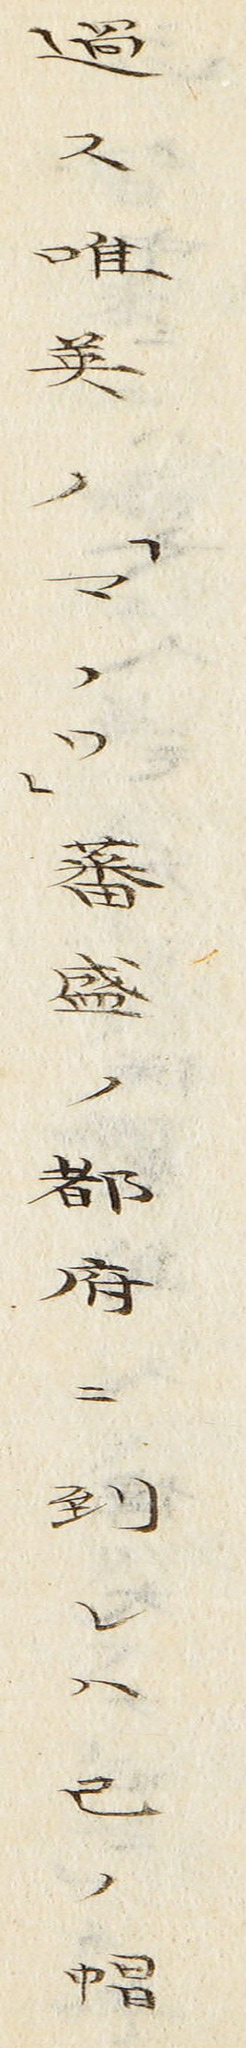過ス唯英ノ「マノワ」蕃盛ノ都府ニ到レハ己ノ帽
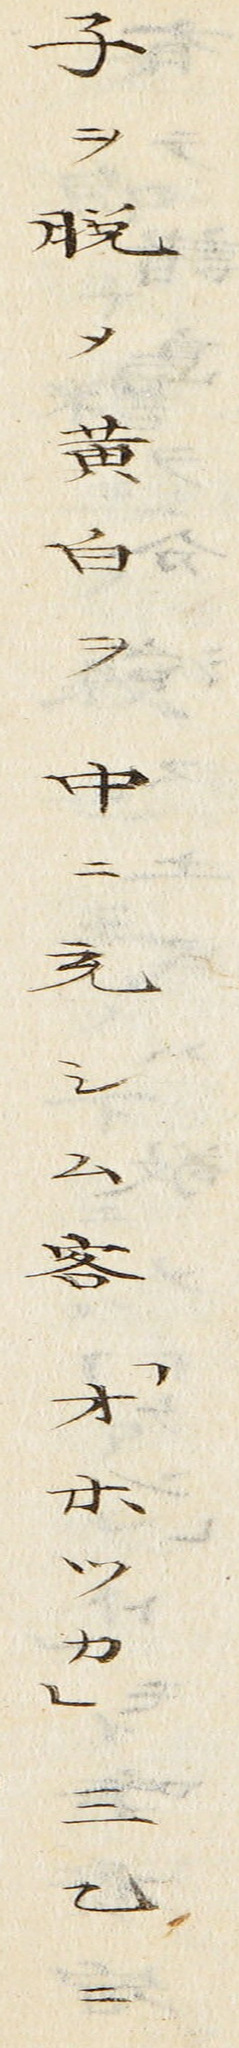子ヲ脱シテ黄白ヲ中ニ充シム客「オホツカ」三乙ニ
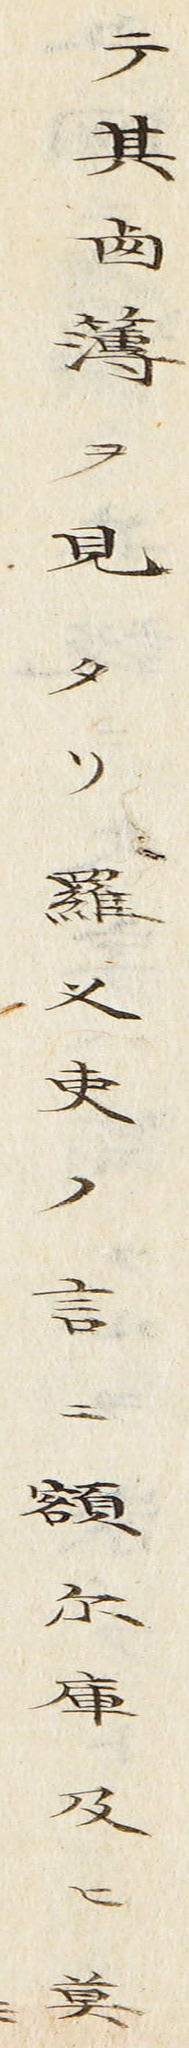テ其鹵簿ヲ見タリ羅又吏ノ言ニ額尓庫及ヒ莫
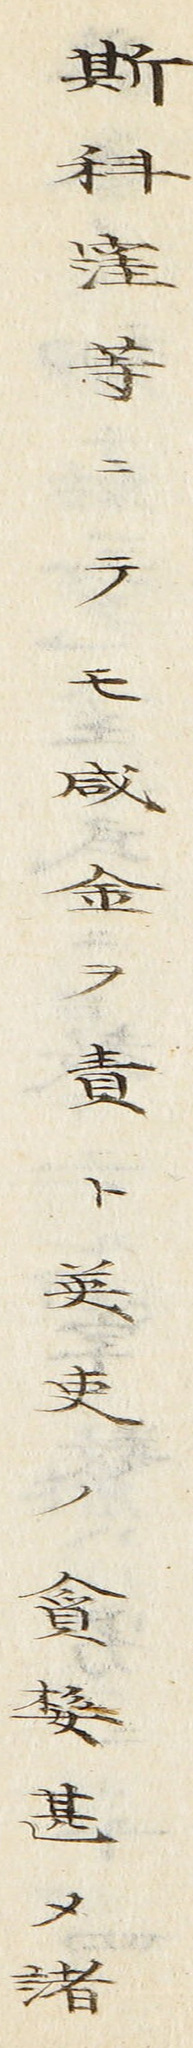斯科窪等ニテモ咸金ヲ責ト英吏ノ貪婪？甚シテ諸
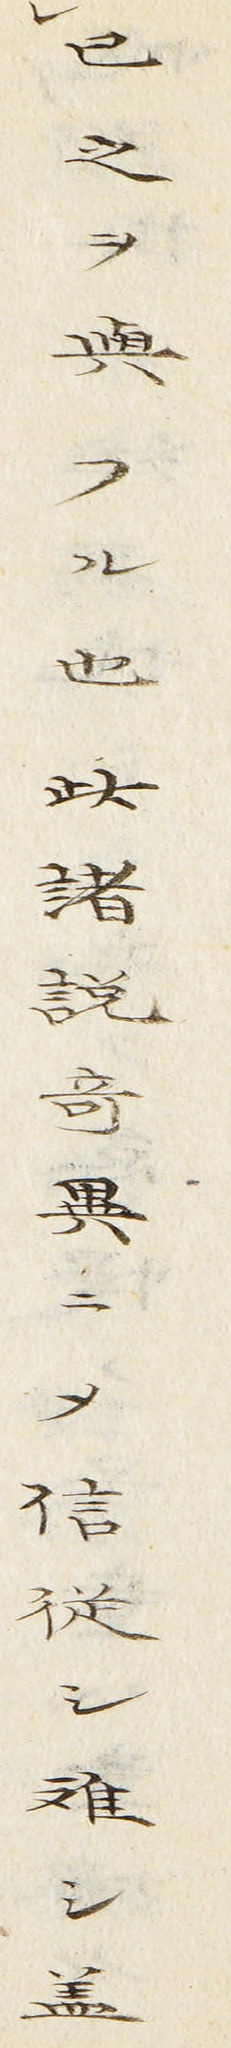已之ヲ与フル也此諸説奇異ニシテ信従シ難シ蓋
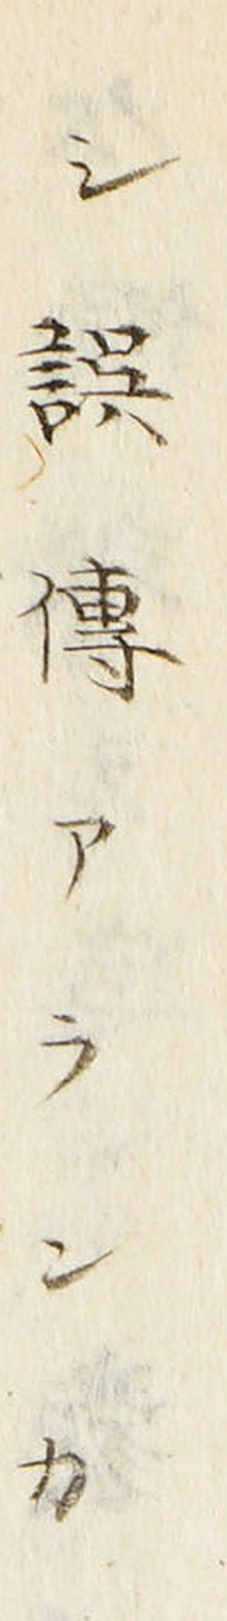シ誤伝アランカ
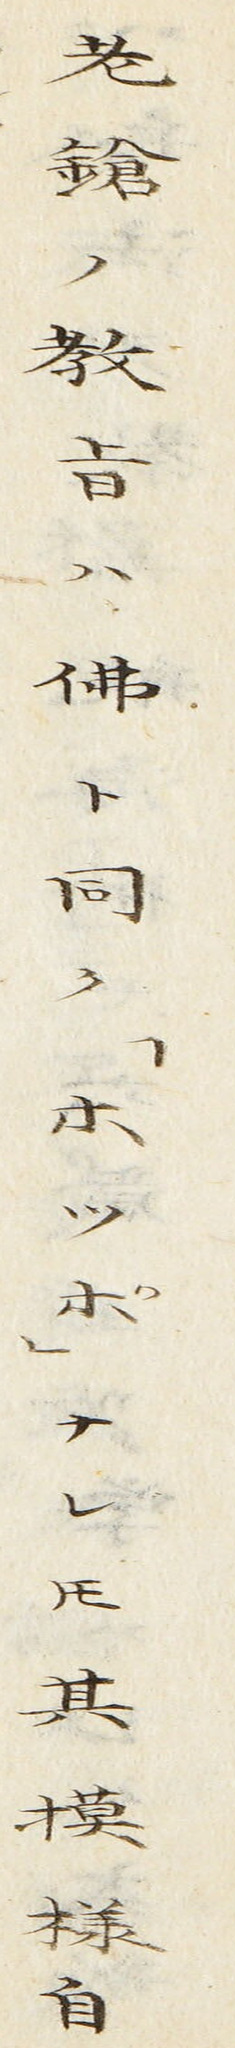〇老鎗ノ教旨ハ仏ト同ク「ホッポ」ナレトモ其模様自
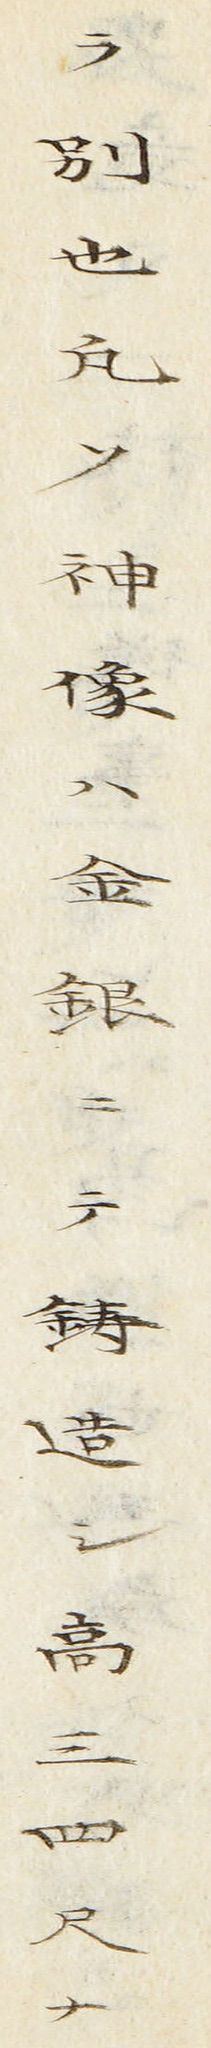ラ別也凡ソ神像ハ金銀ニテ鋳造シ高三四尺ナ
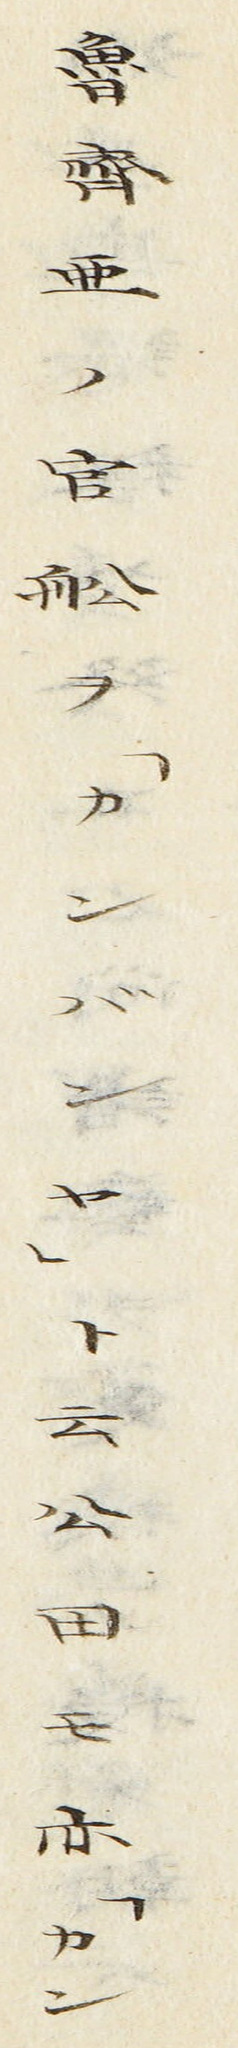〇魯斉亜ノ官舩ヲ「カンバンヤ」ト云公田モ亦「カン

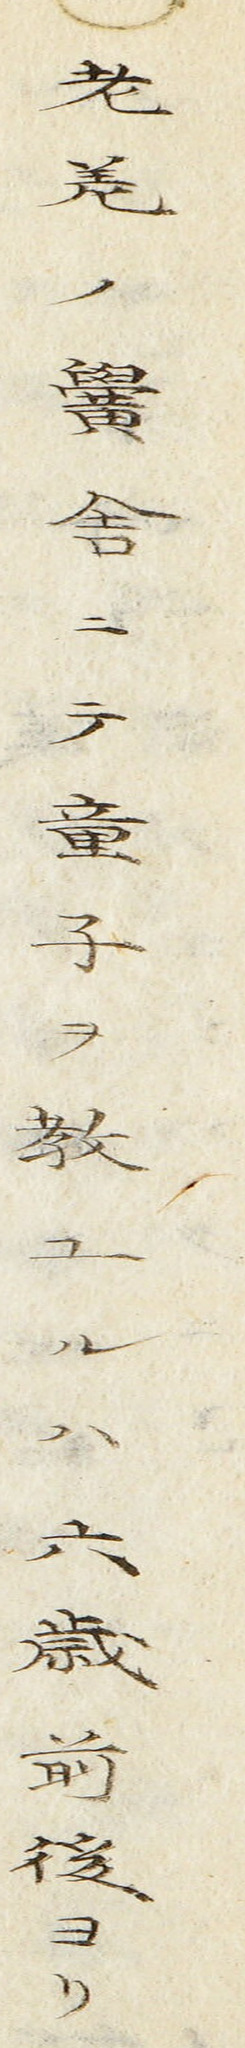〇老羗ノ侯黌舎ニテ童子ヲ教ユルハ六歳前後ヨリ
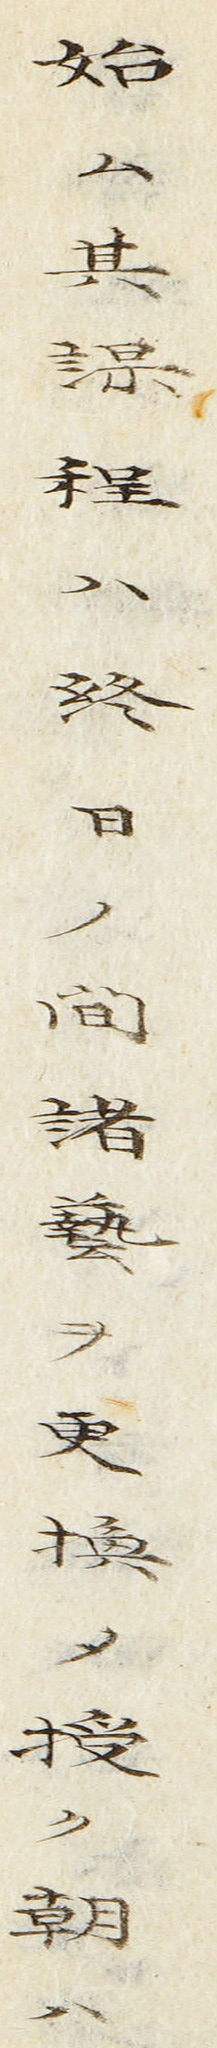始ム其課程ハ終日ノ間諸芸ヲ更換シテ授ク朝ハ
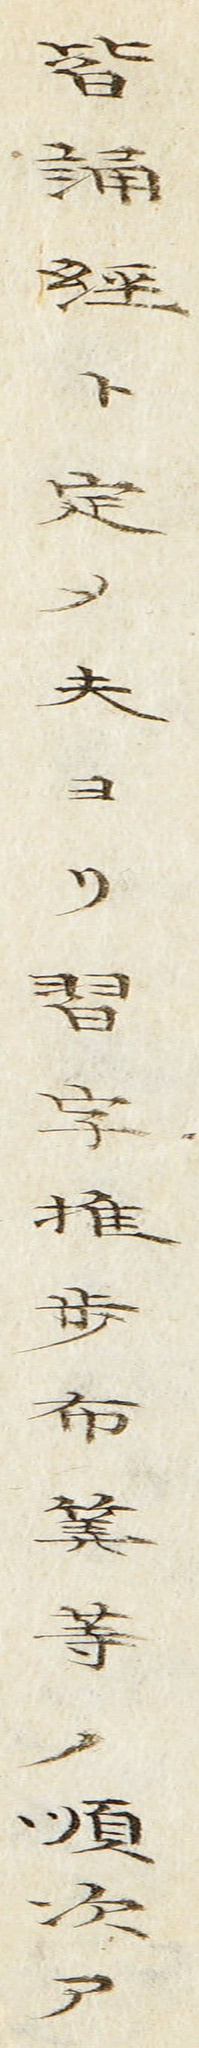皆誦経ト定メ夫ヨリ習字推歩布筭等ノ順次ア
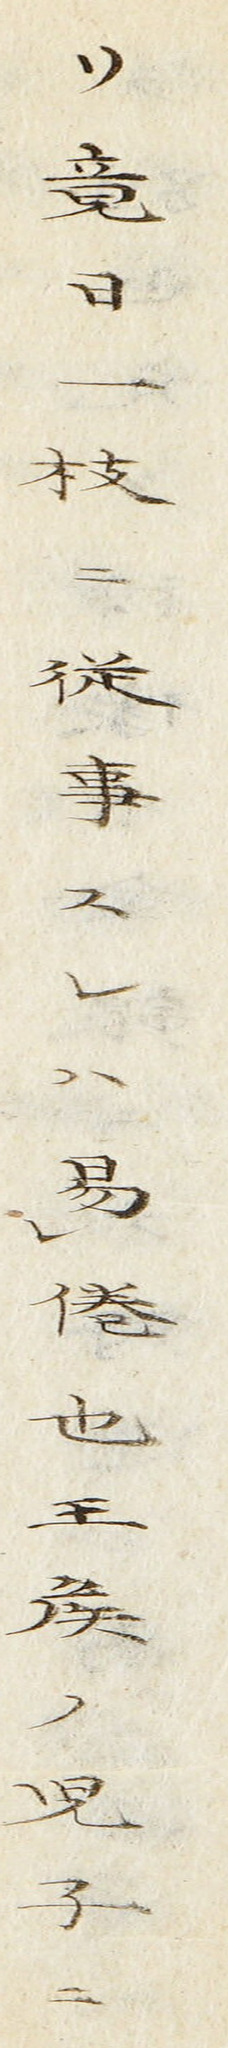リ竟日一枝ニ従事スレハ易倦也王矦ノ児子ニ
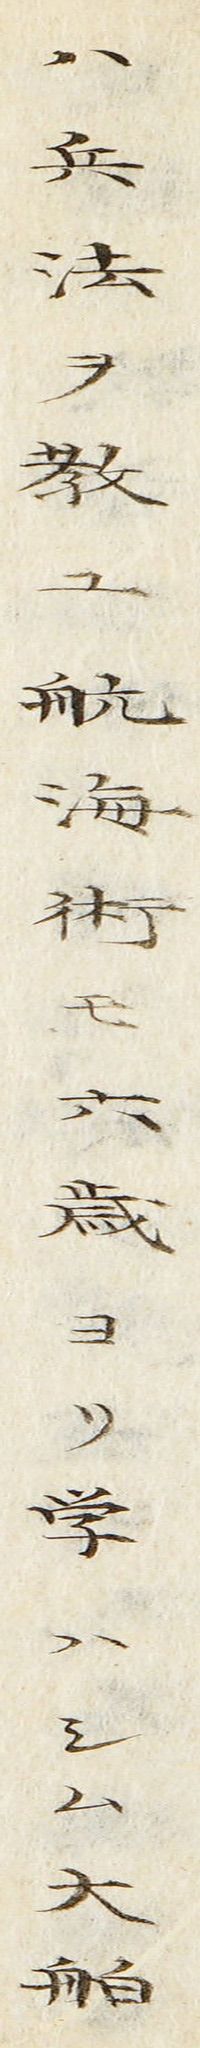ハ兵法ヲ教ユ航海術モ六歳ヨリ学ハシム大舶
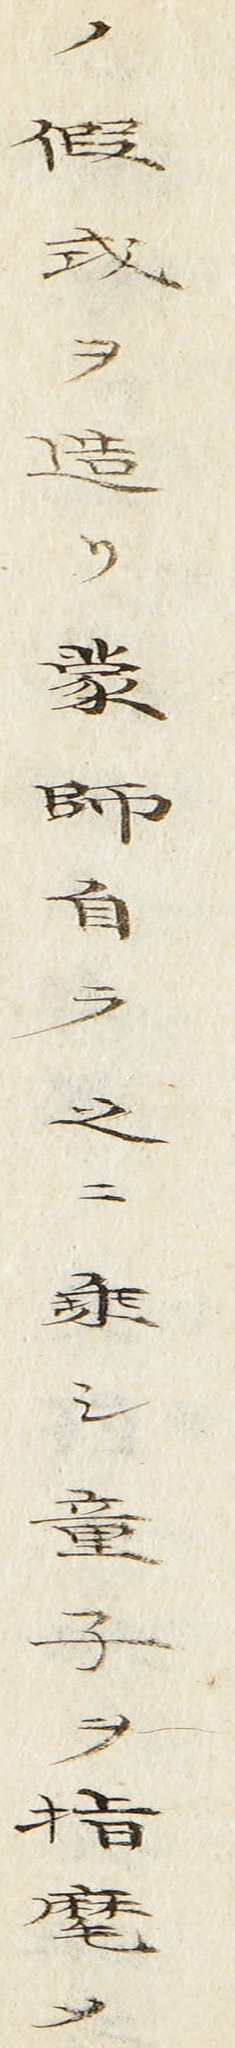ノ仮式？ヲ造リ蒙師自ラ之ニ乗シ童子ヲ指麾シテ
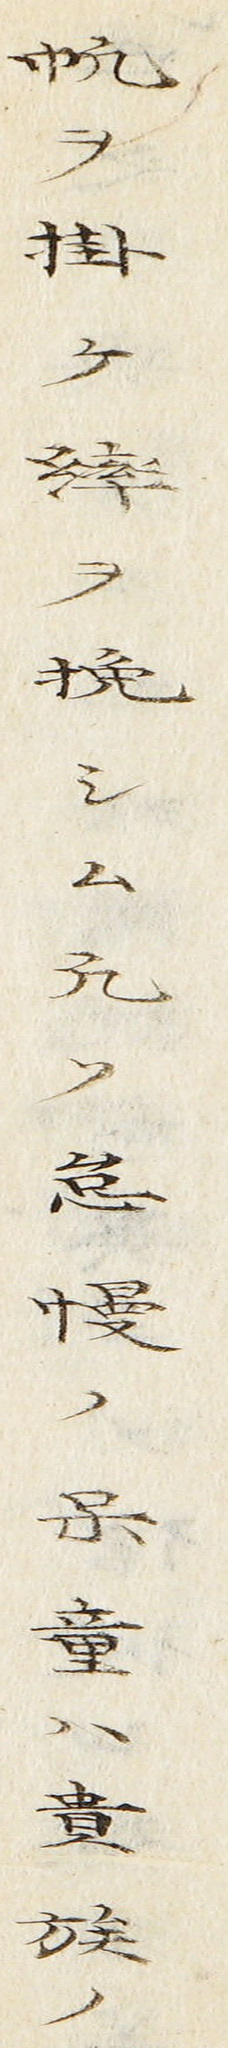帆ヲ掛ケ繂ヲ挽シム凡ソ怠慢ノ呆童ハ貴族ノ
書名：蕃談
